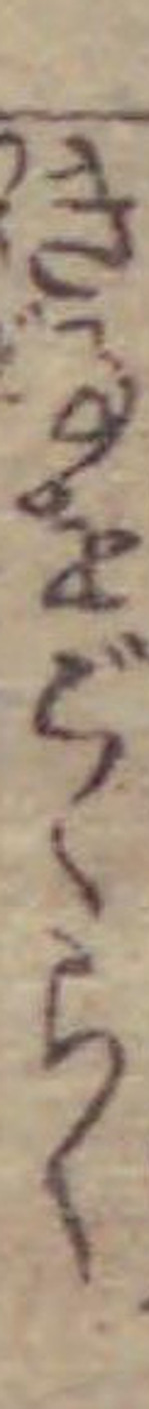き事をごくらく
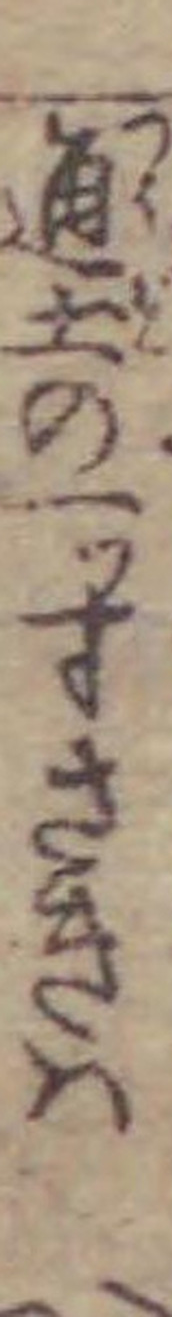通土の一寸さきは
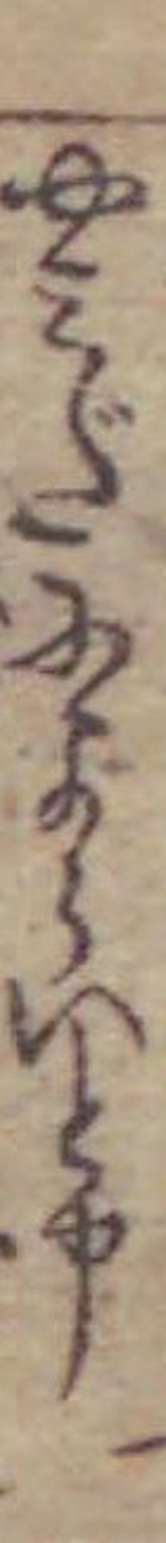やみだによらいと申
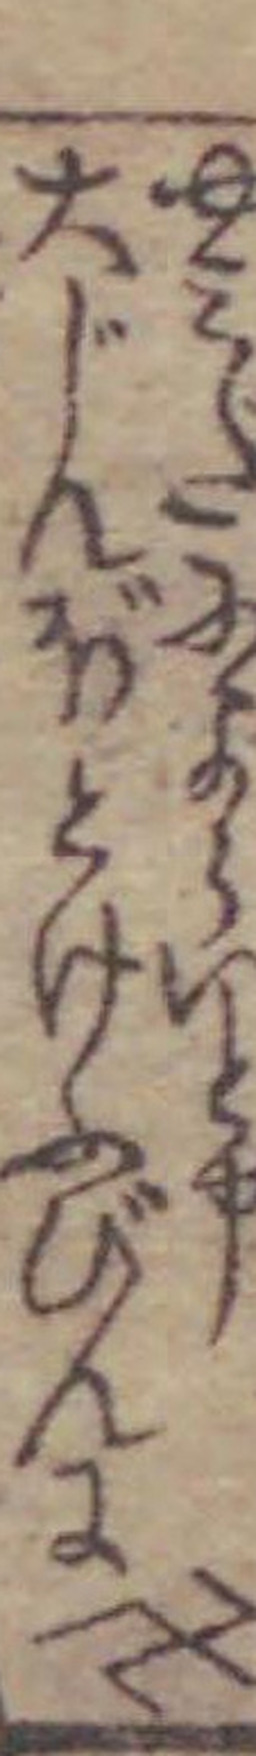大じんぼとけふびんに
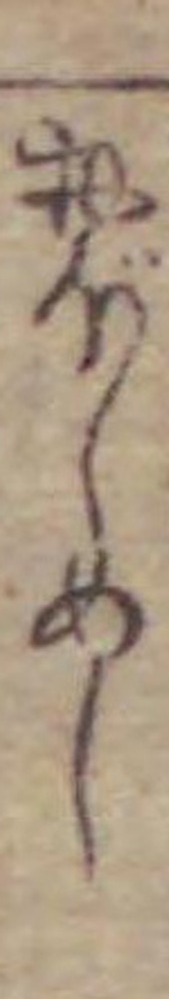おぼしめし
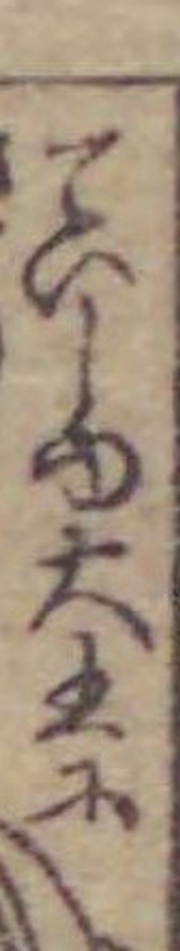ていしゆ大王に
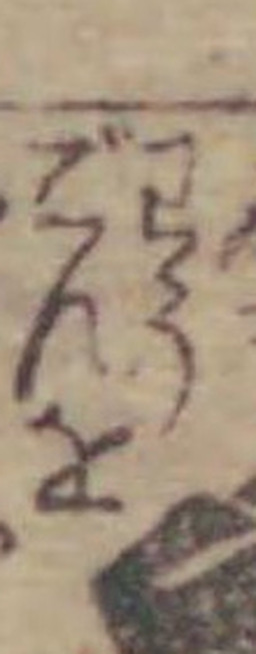ごんを
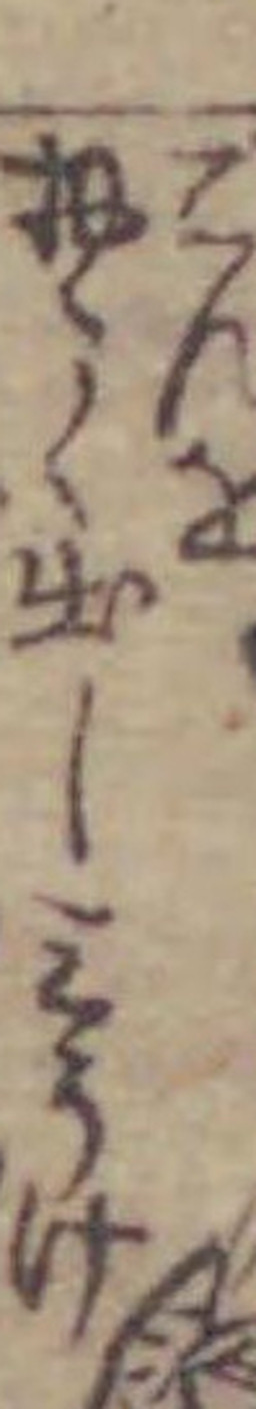おゝく出しみうけ
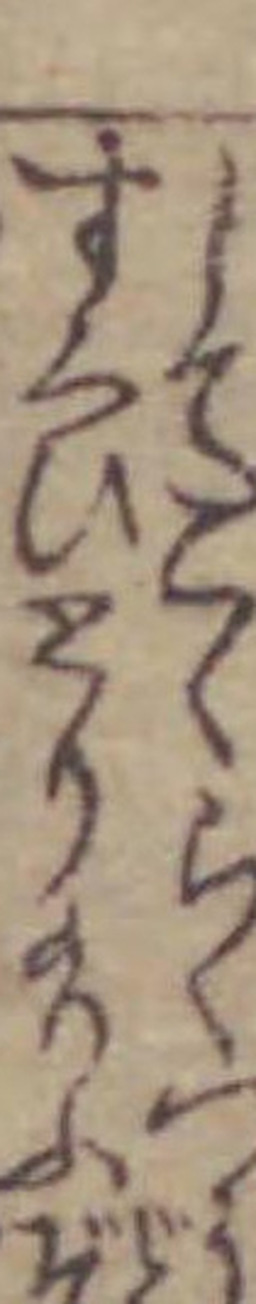すくひとり給ふぞ
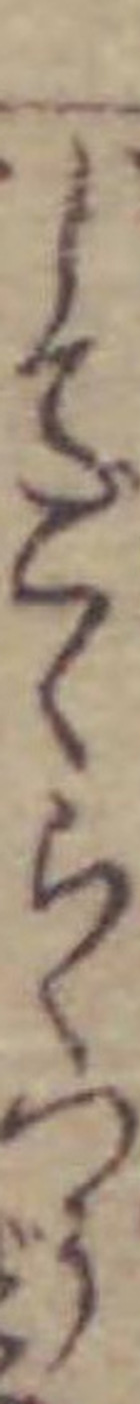してごくらくつうどへ
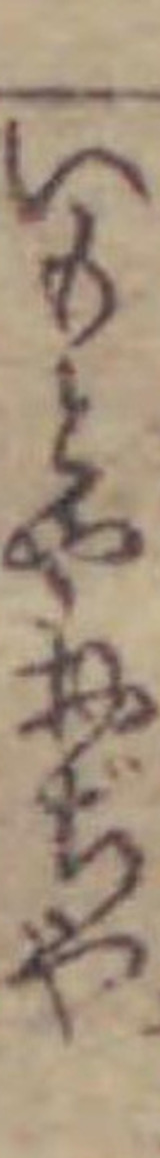いもとやおぢや
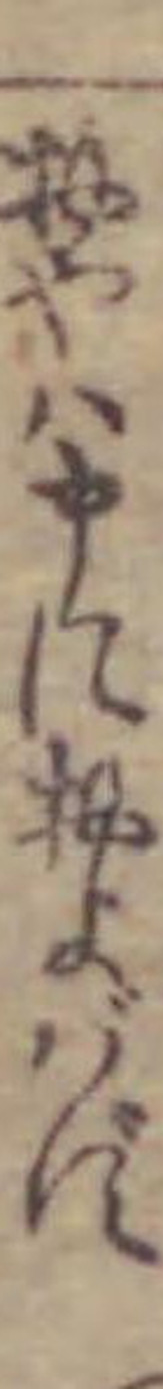おやは申におよばず
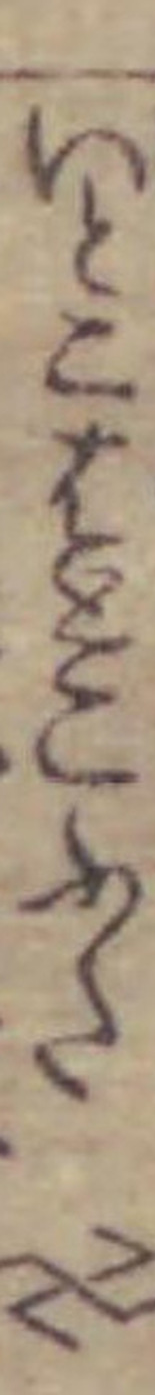いとこはとこふた
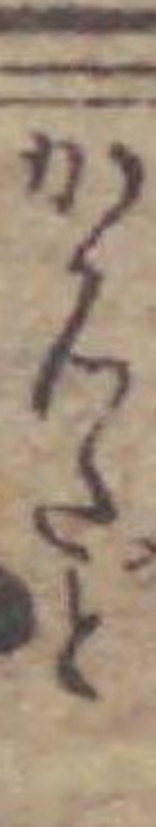かゝつたと
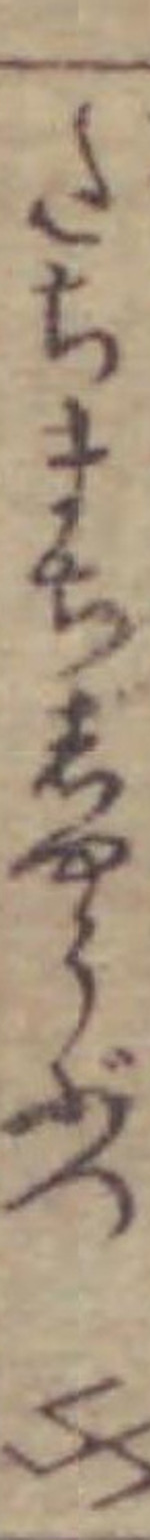たちまちじやうぶつ
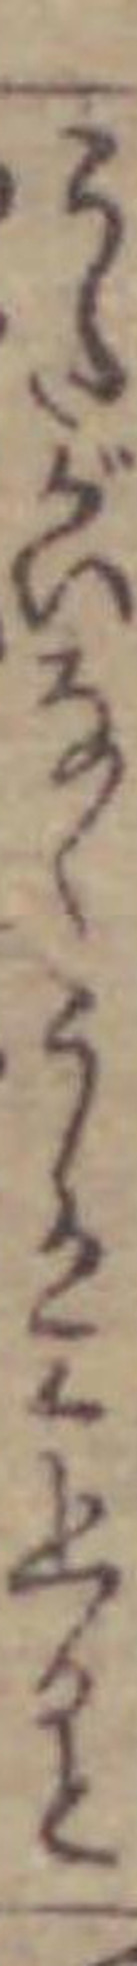うたがいなくうかみ上ると
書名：九替十年色地獄 : 3巻
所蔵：国立国会図書館 National Diet Library, JAPAN
